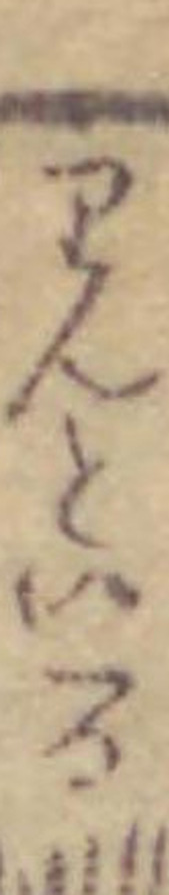りんといへる
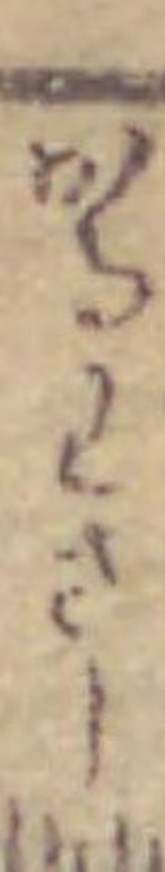かるわさし
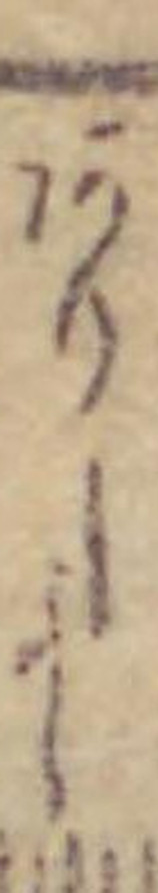ありしよし
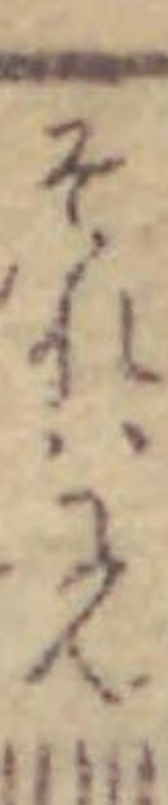それはにん
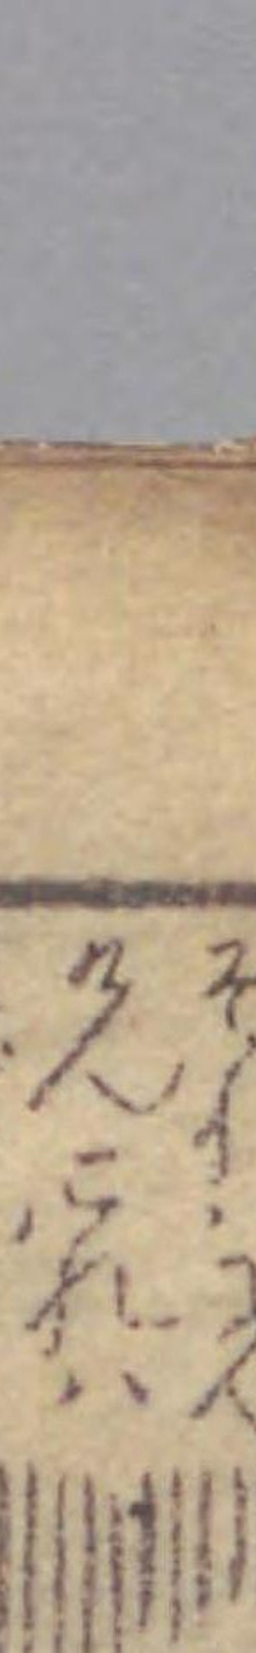けんこれは
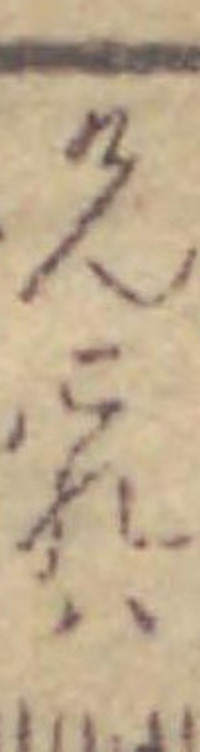けんこれは
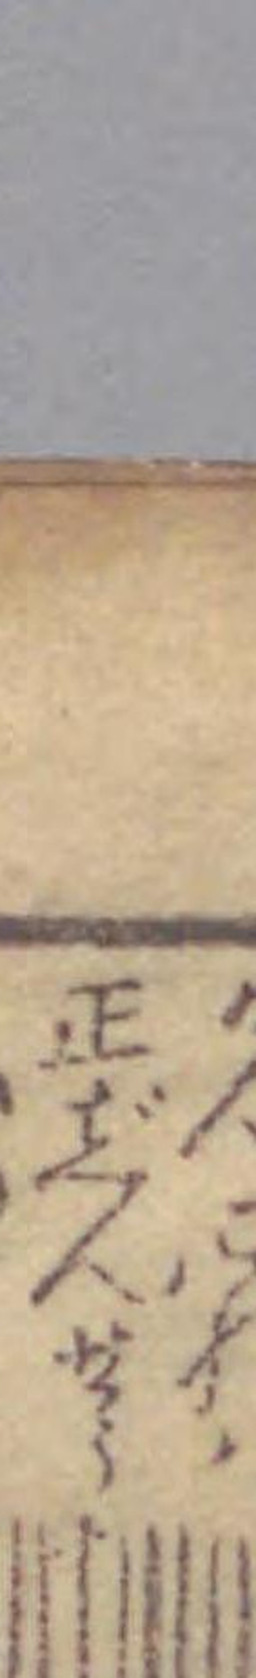正じんせう
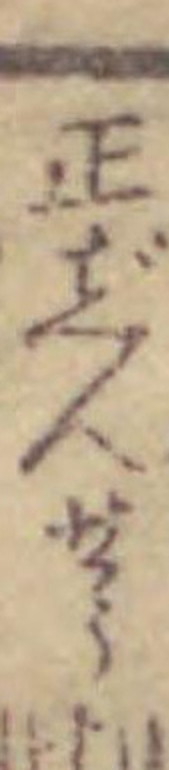正じんせう
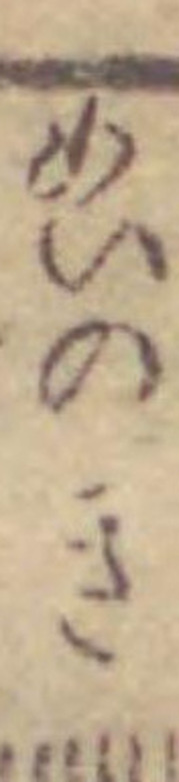めいのき
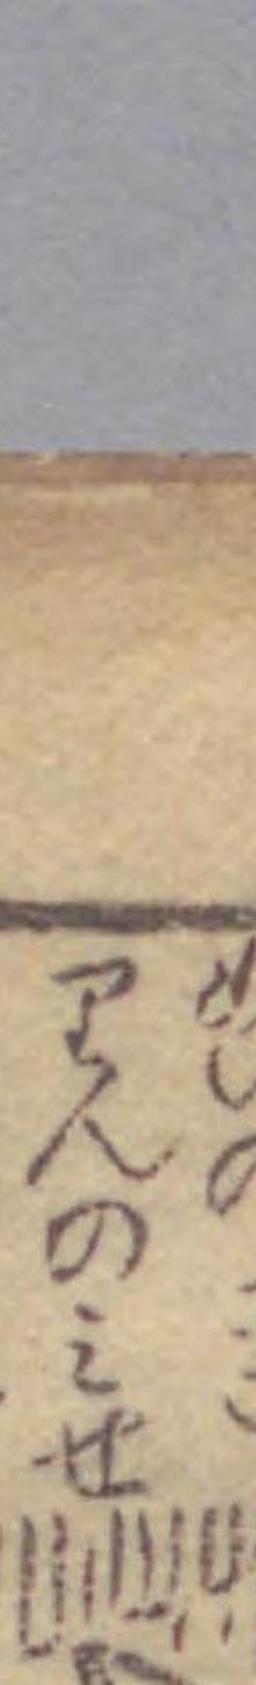りんのみせ
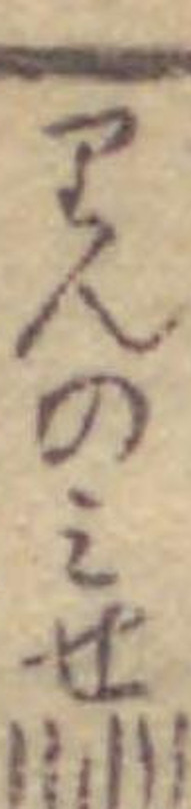りんのみせ
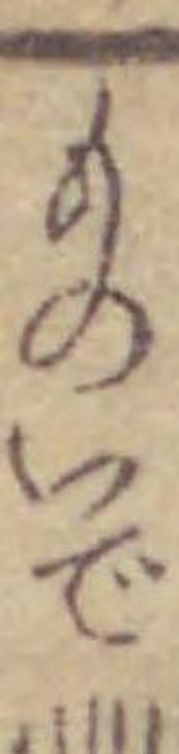ものいで
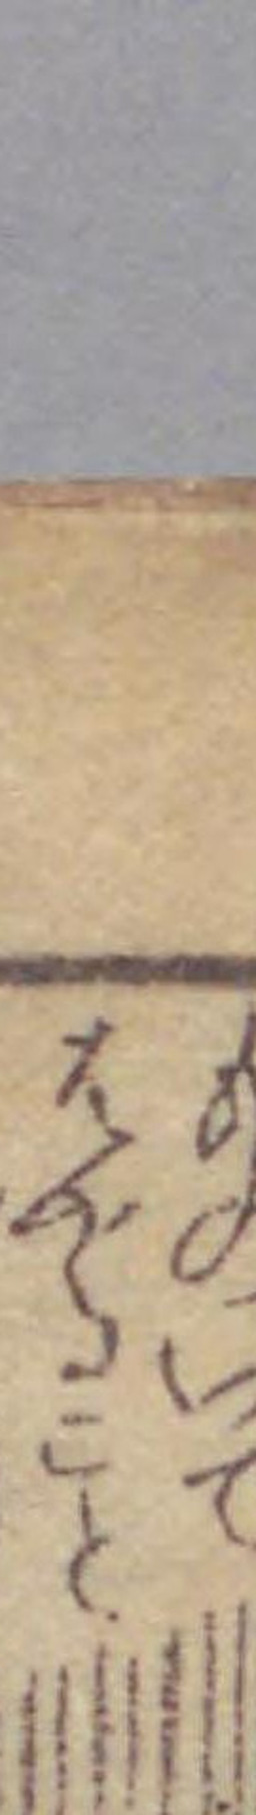はやること
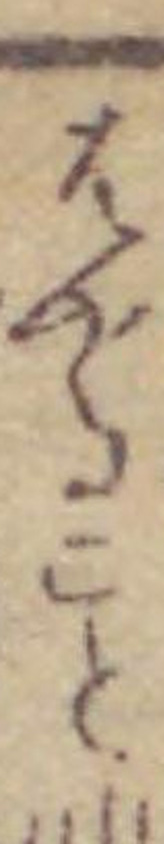はやること
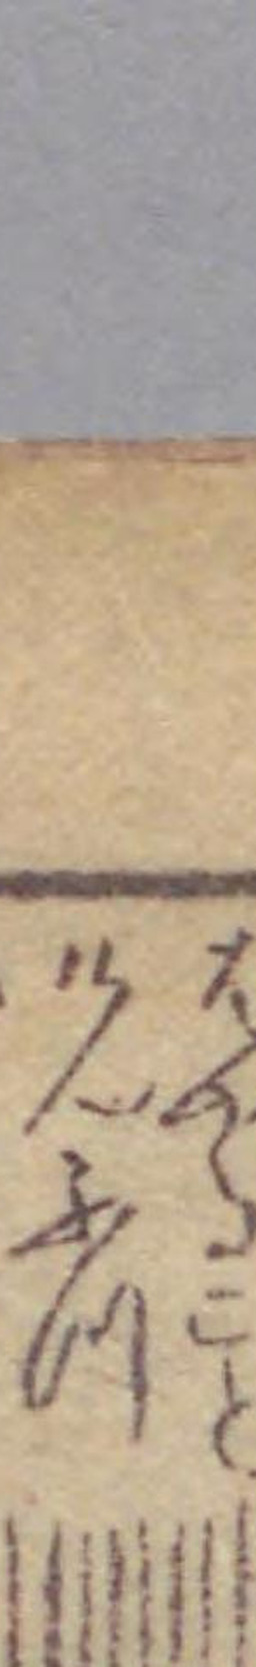けんふつ
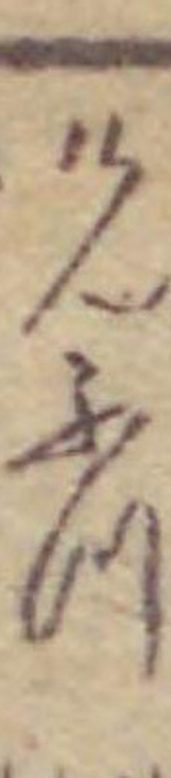けんふつ
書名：天下一面鏡梅鉢 : 3巻
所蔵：国立国会図書館 National Diet Library, JAPAN
